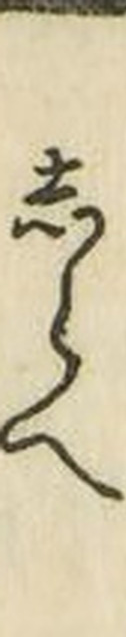しらへ
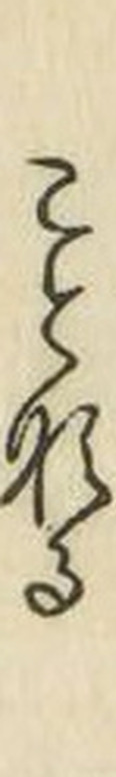ことなる
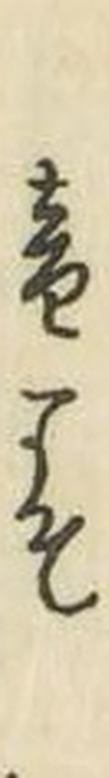音こそ
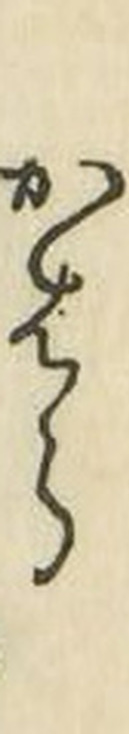かはら
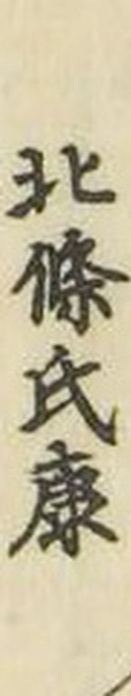北条氏康

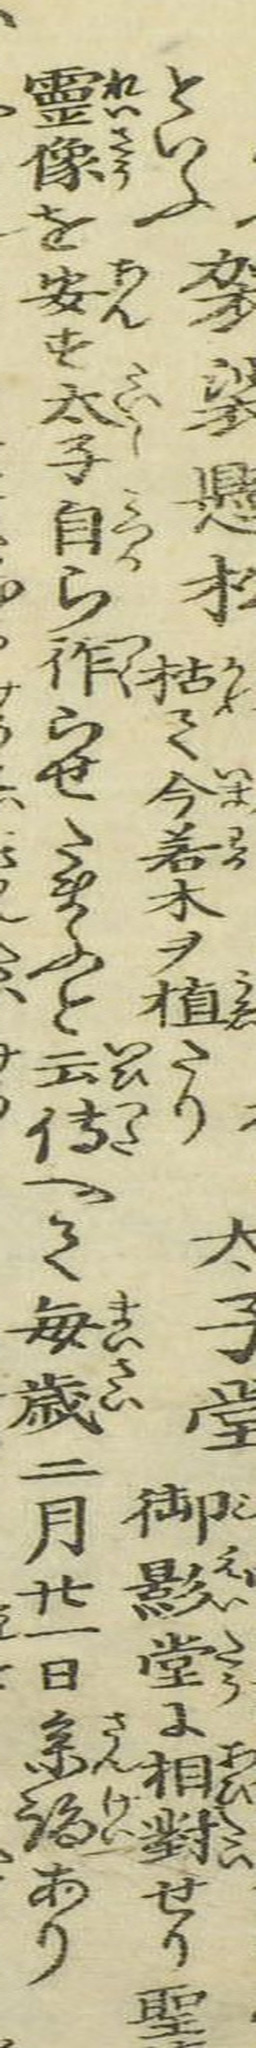霊像を安す太子自ら作らせたまふと云伝へて毎歳二月廿一日参詣あり
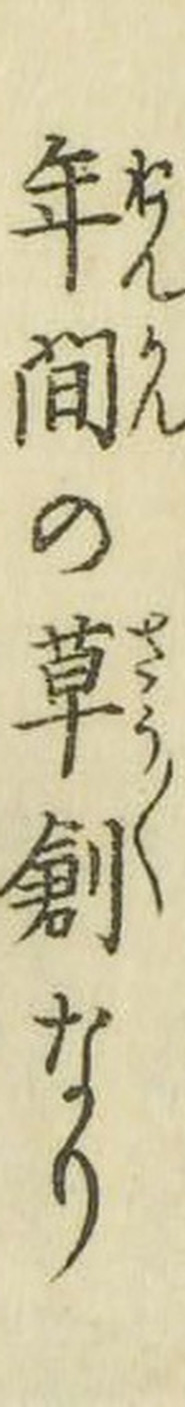年間の草創なり
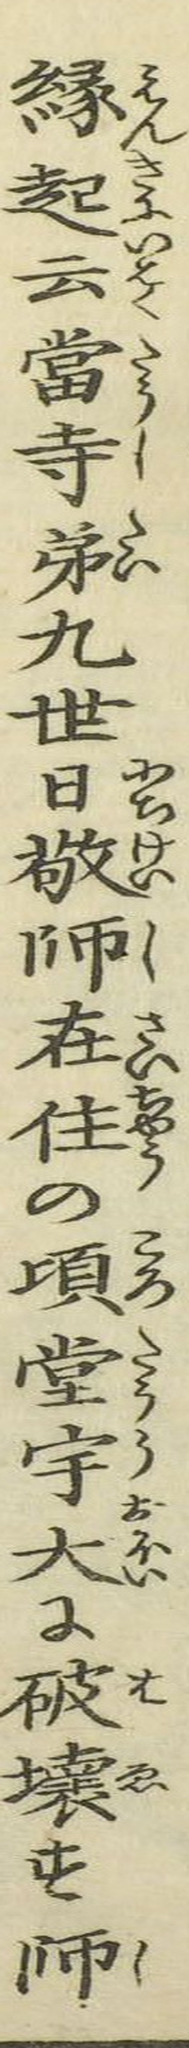縁起云当寺弟九世日敬師在住の頃堂宇大に破壊す師
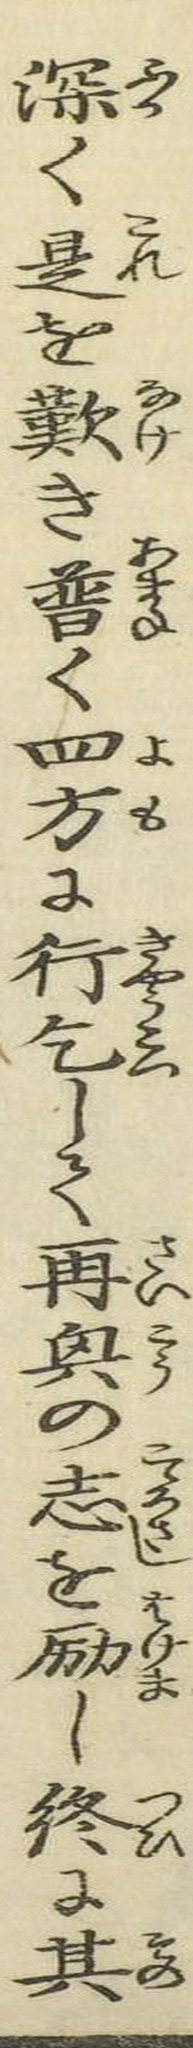深く是を歎き普く四方に行乞して再興の志を励し終に其
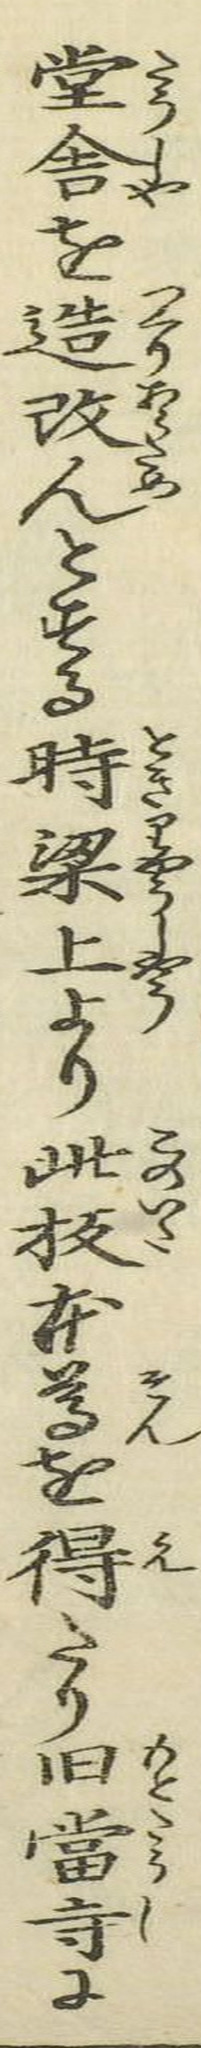堂舎を造改んとする時梁上より此板本尊を得たり旧当寺に
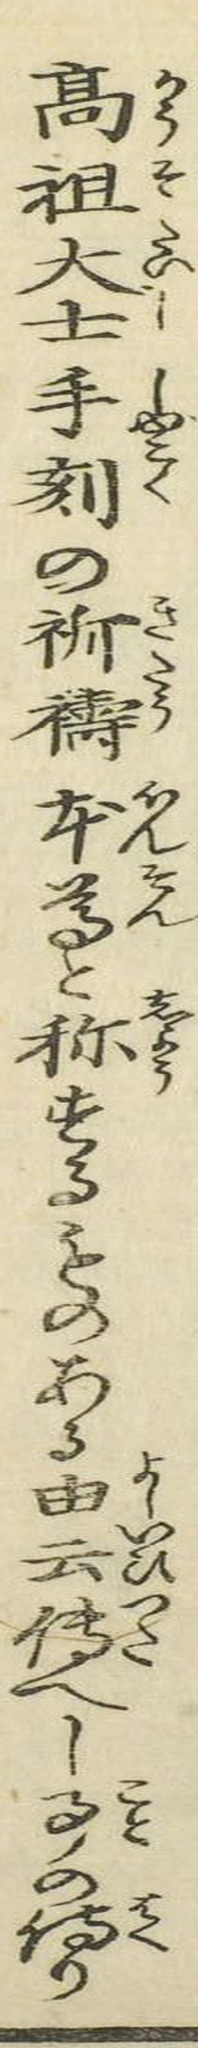高祖大士手刻の祈祷本尊と称するものある由云伝へし事の侍り
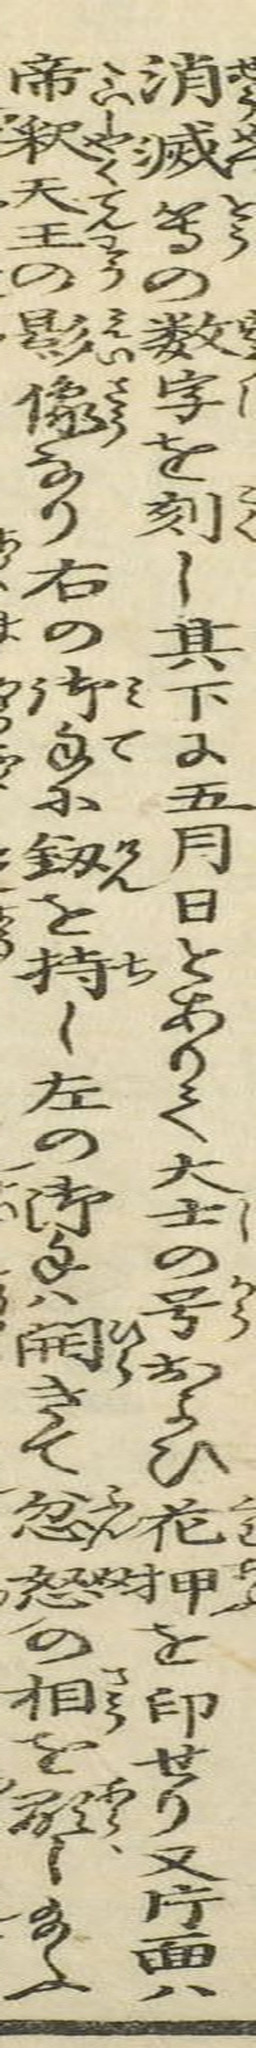帝釈天王の影像なり右の御手に剣を持し左の御手は開きて憤怒の相を顕し給ふ
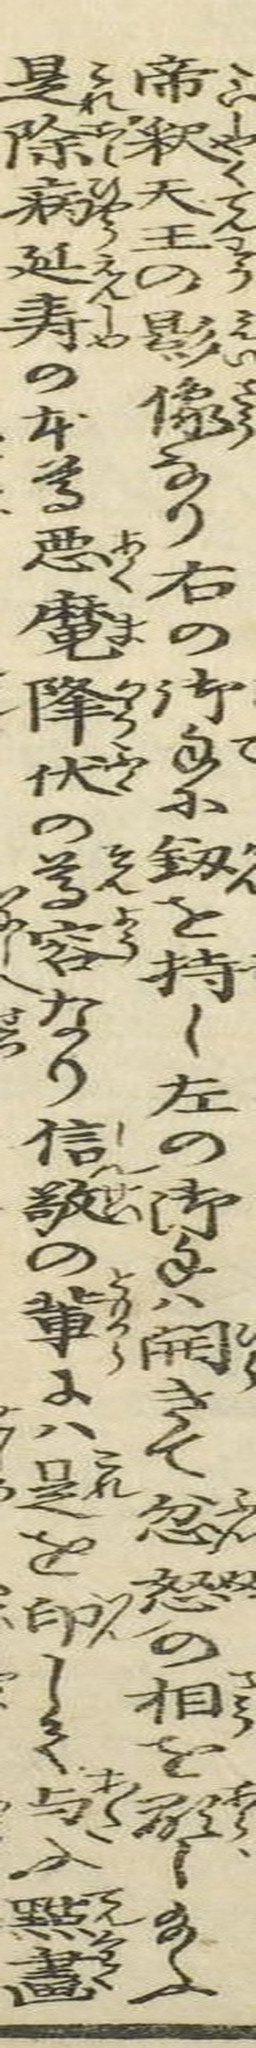是除病延寿の本尊悪魔降伏の尊容なり信敬の輩には是を印して与ふ点画
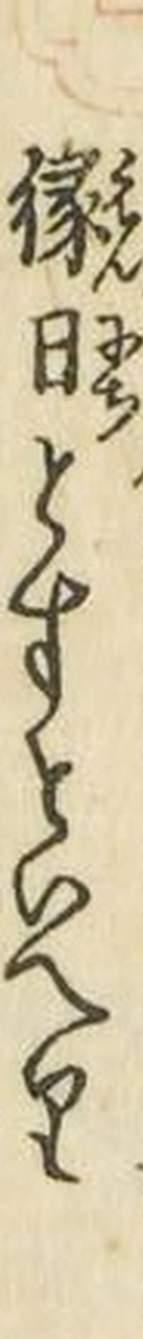縁日とすといへり
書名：江戸名所図会 20巻 巻之19
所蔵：東京学芸大学教育コンテンツアーカイブ
